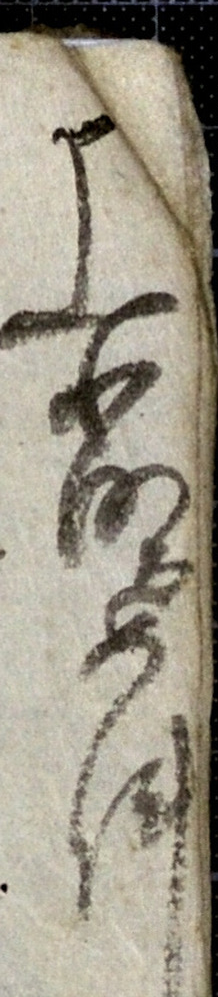申上候仍而如件
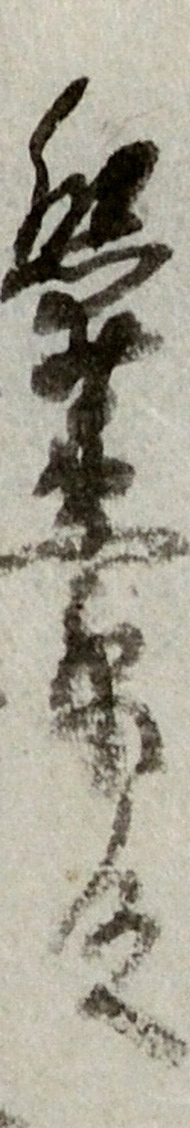熊井杢兵衛殿
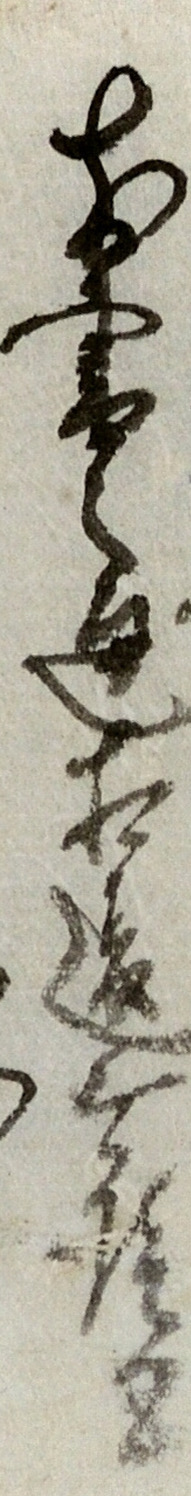前書之通相違無御座候以上
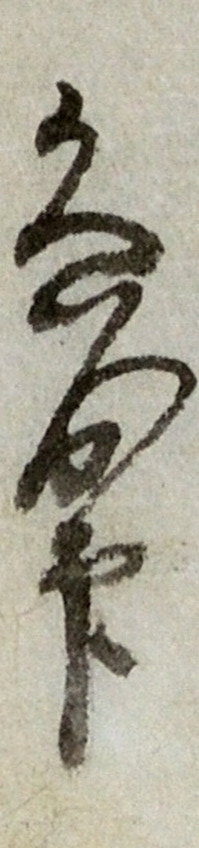久左衛門印
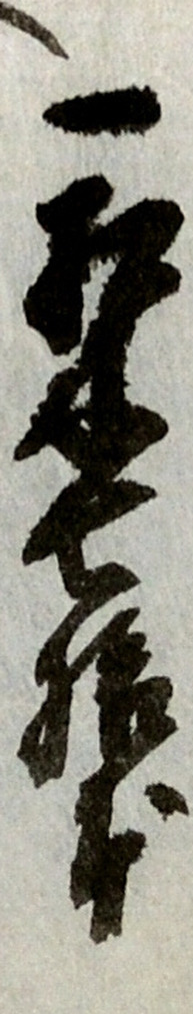一松木七拾本
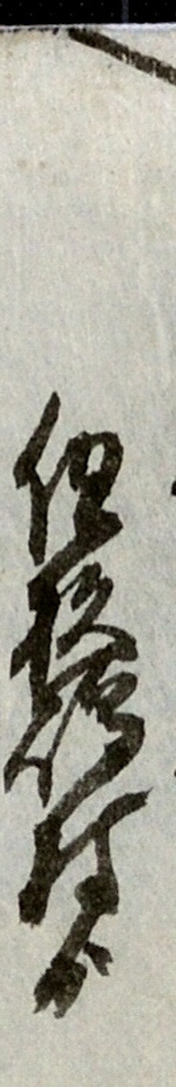但杉嶋村ゟ
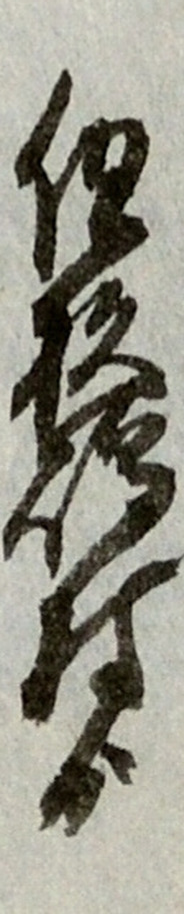但杉嶋村ゟ
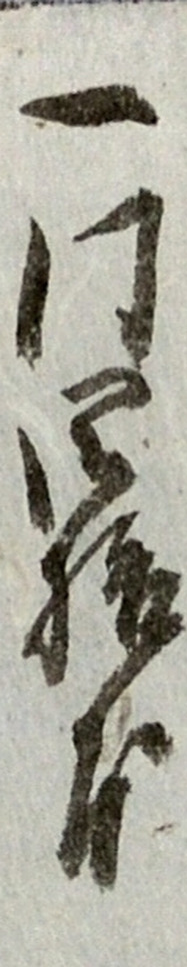一同四拾本
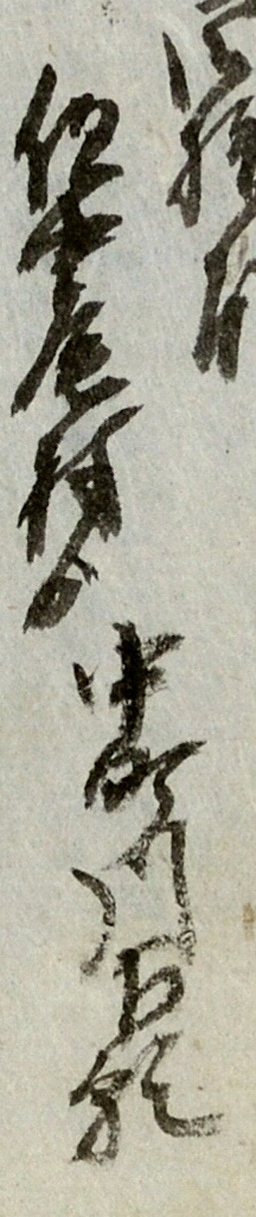但中尾村ゟ中町川下願
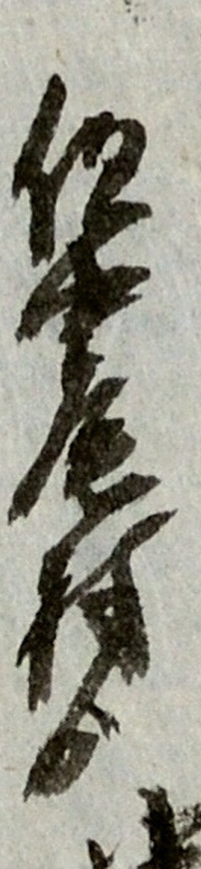但杉嶋村ゟ
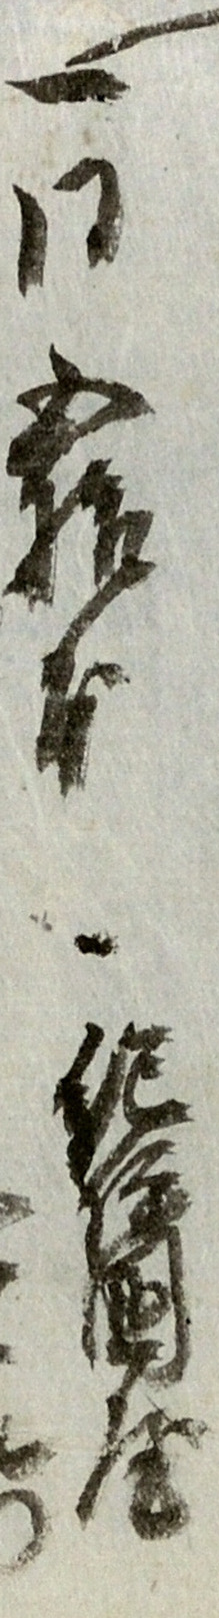一同五拾本紀伊国屋
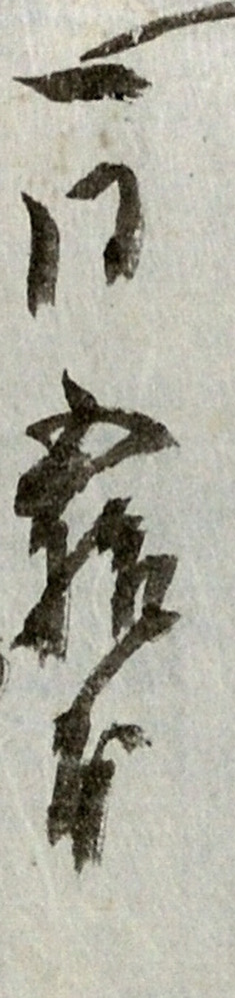一同四拾本
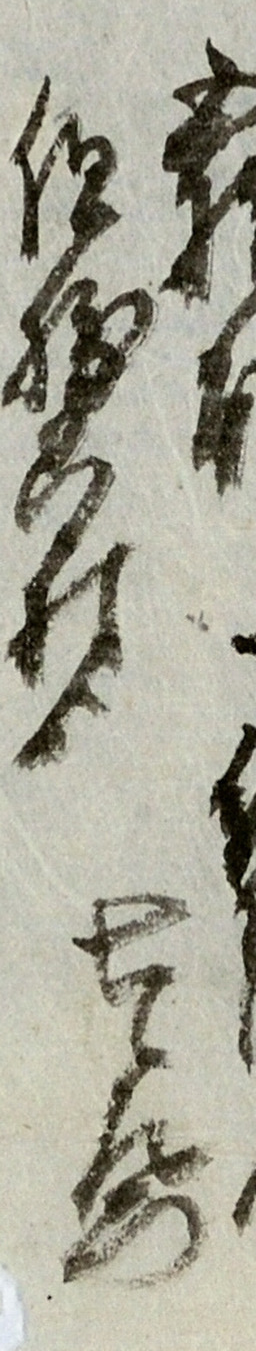但勝間村ゟ七左衛門
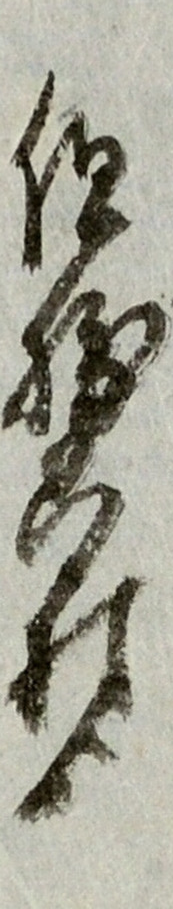但杉嶋村ゟ
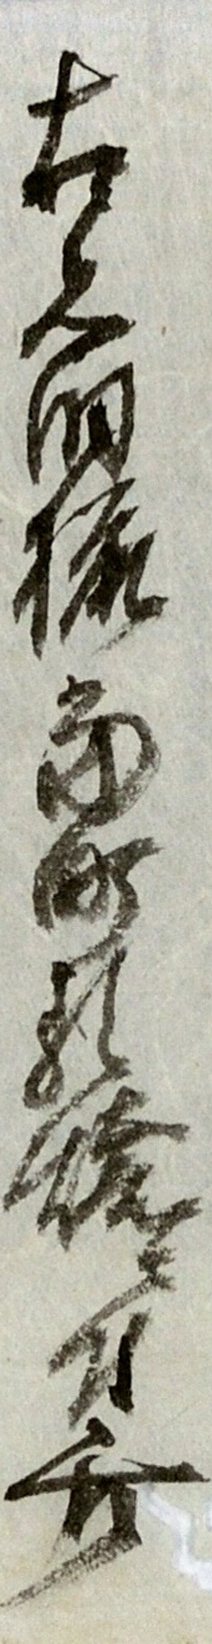右は旧臘当町類焼ニ付此
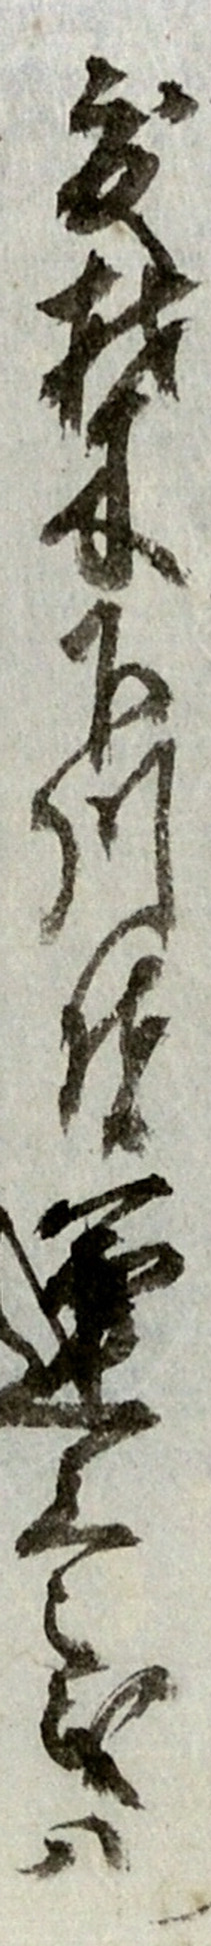度材木下川候運上之義ハ
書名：分一方諸事御用留帳
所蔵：伊那市立高遠町図書館・合同会社AMANE
